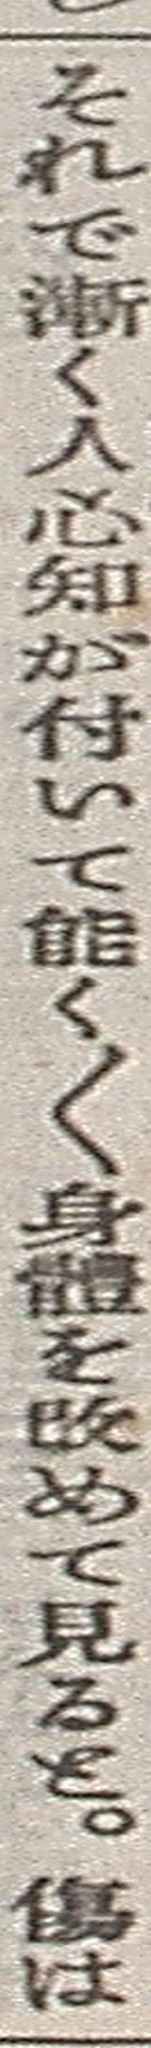それで漸く人心知が付いて能く〳〵身体を改めて見ると。傷は
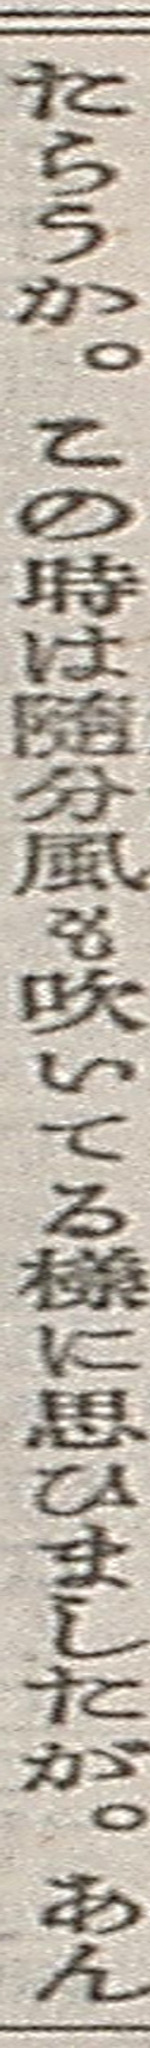たらうか。この時は随分風も吹いてる様に思ひましたが。あん
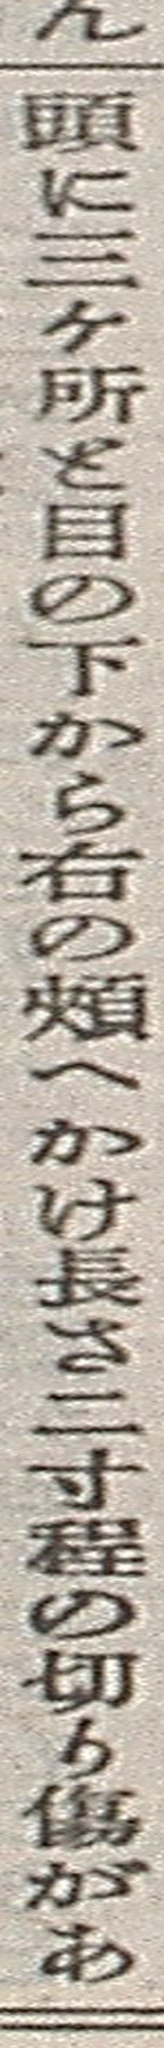頭に三ケ所と目の下から右の頬へかけ長さ二寸程の切り傷があ
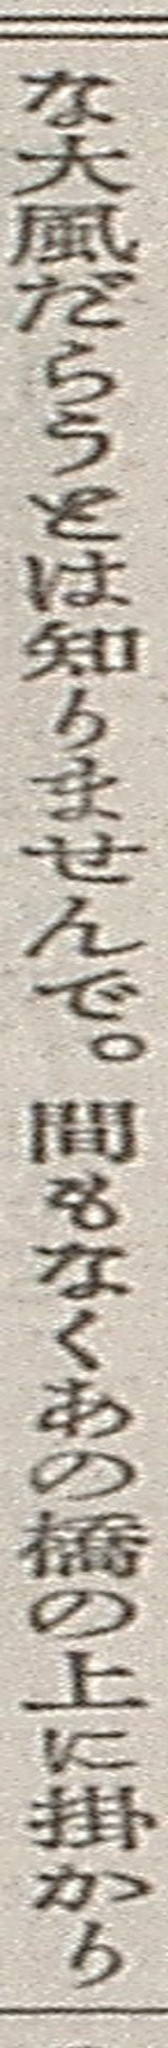な大風だらうとは知りませんで。間もなくあの橋の上に掛かり
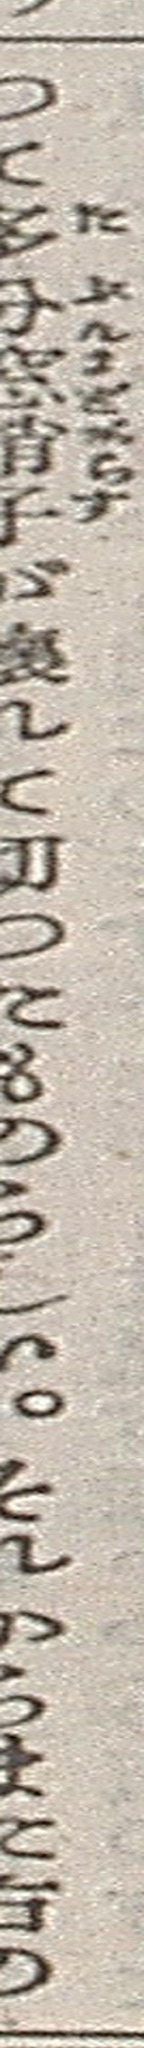つて多分窓硝子が壊れて切つたものらしい。それからまた右の
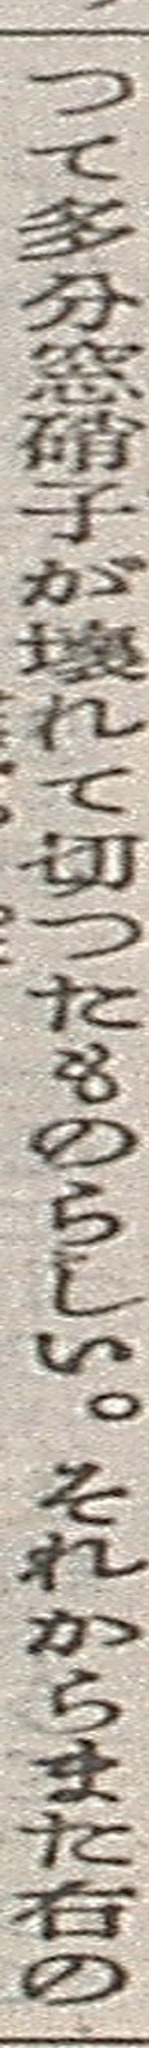つて多分窓硝子が壊れて切つたものらしい。それからまた右の
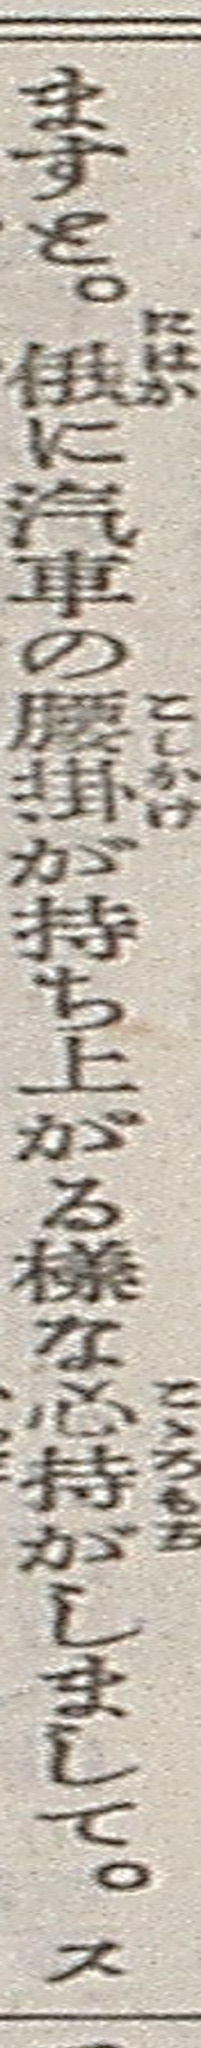ますと。俄に汽車の腰掛が持ち上がる様な心持がしまして。ス
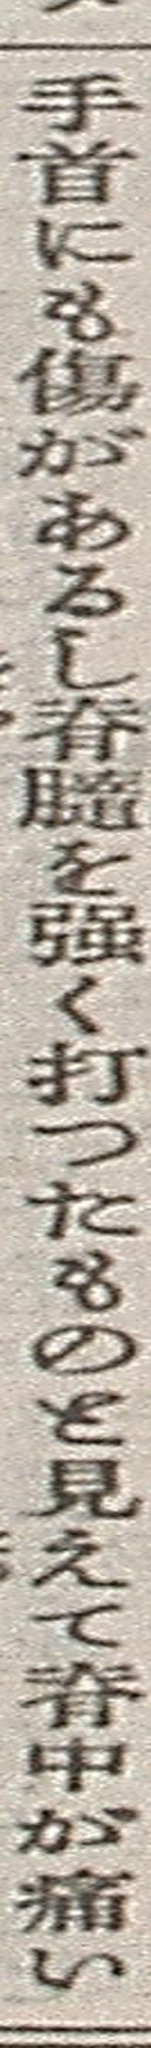手首にも傷があるし脊膸を強く打つたものと見えて背中が痛い
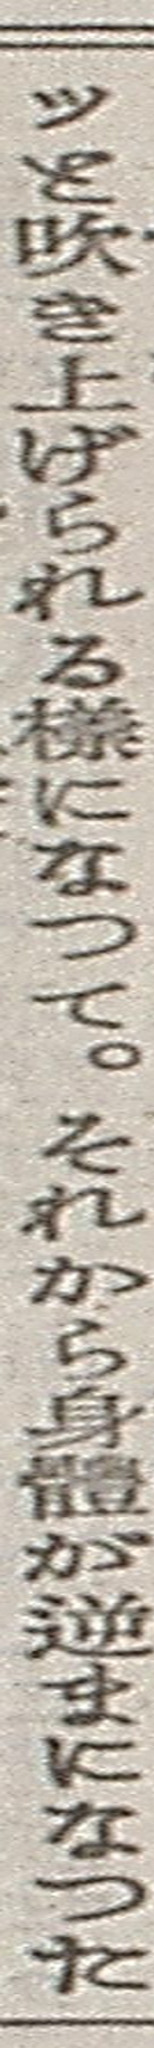ツと吹き上げられる様になつて。それから身体が逆まになつた
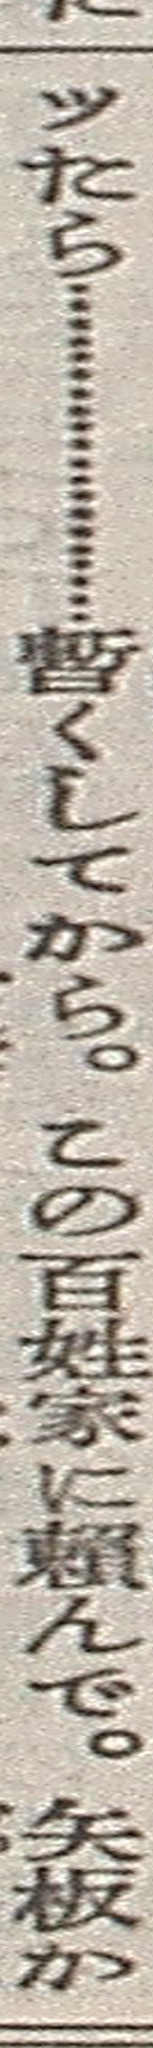ツたら…………………暫くしてから。この百姓家に頼んで。矢板か
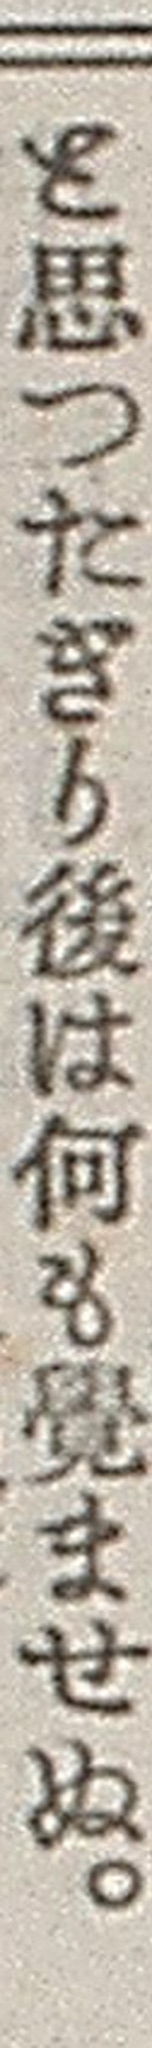と思つたぎり後は何も覚ませぬ。
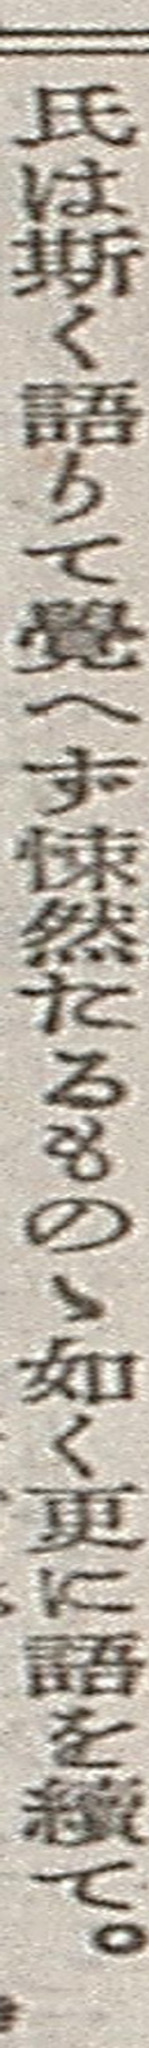氏は斯く語りて覚へず悚然たるものゝ如く更に語を続て。
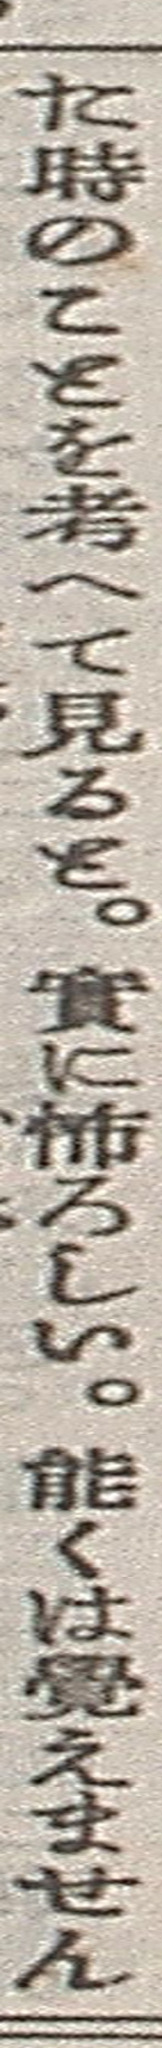た時のことを考へて見ると。実に怖ろしい。能くは覚えません
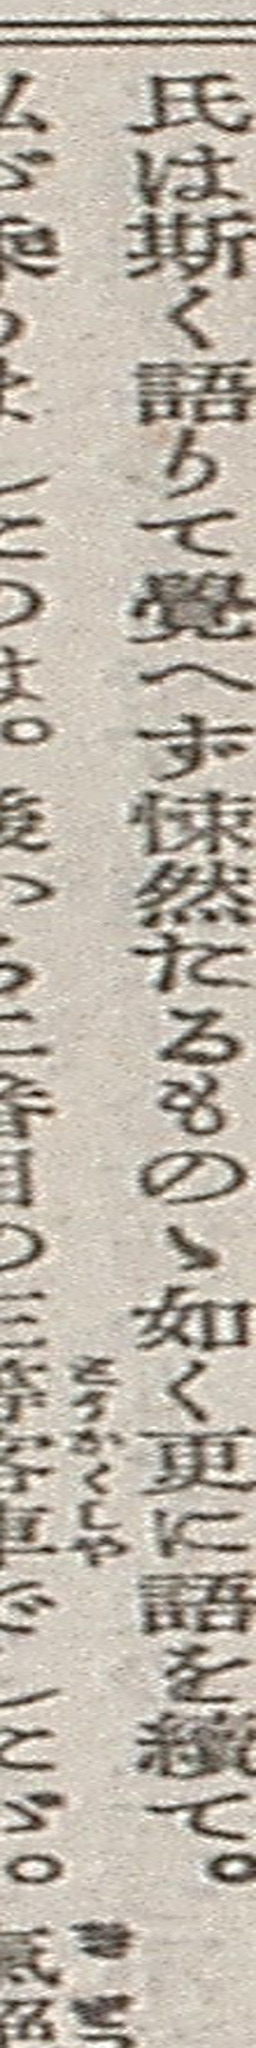私が乗りましたのは。後から二番目の三等客車でしたが。気絶
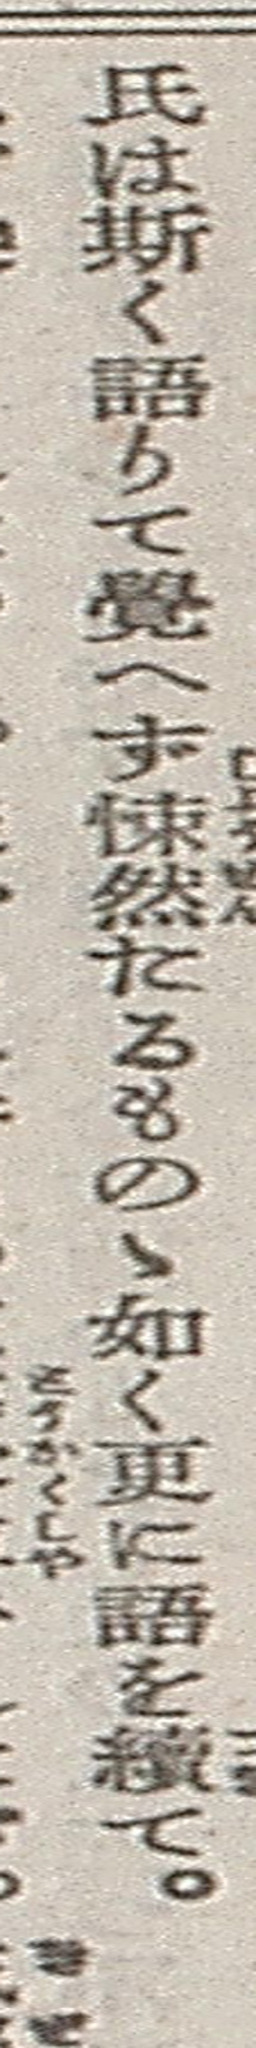氏は斯く語りて覚へず悚然たるものゝ如く更に語を続て。
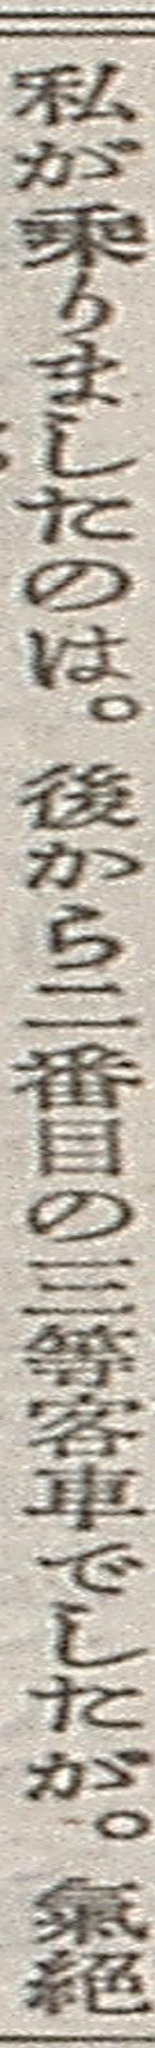私が乗りましたのは。後から二番目の三等客車でしたが。気絶
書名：風俗畫報臨時増刊第百九十九號　明治三十二年十月各地災害圖會（前編之續）
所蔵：東京大学地震研究所図書室 Earthquake Research Institute Library, The University of Tokyo, JAPAN
